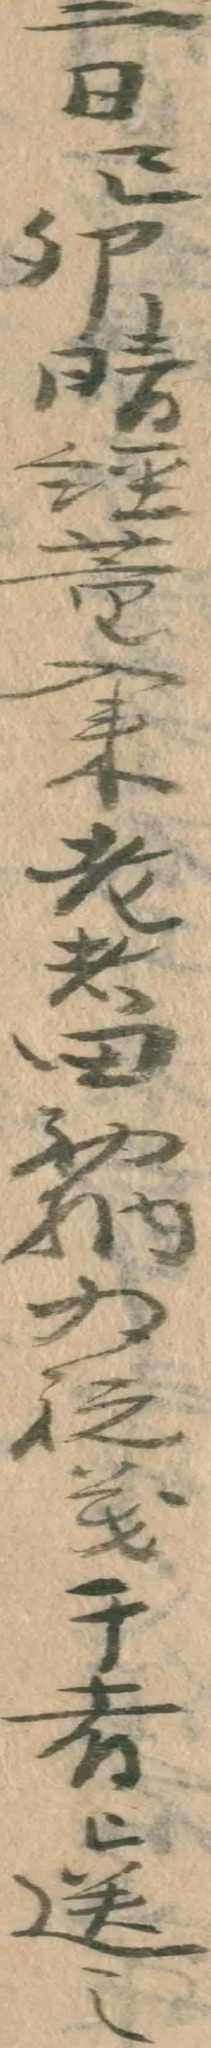二日己卯晴、経董入来、老者田初納為祝義干肴被送之
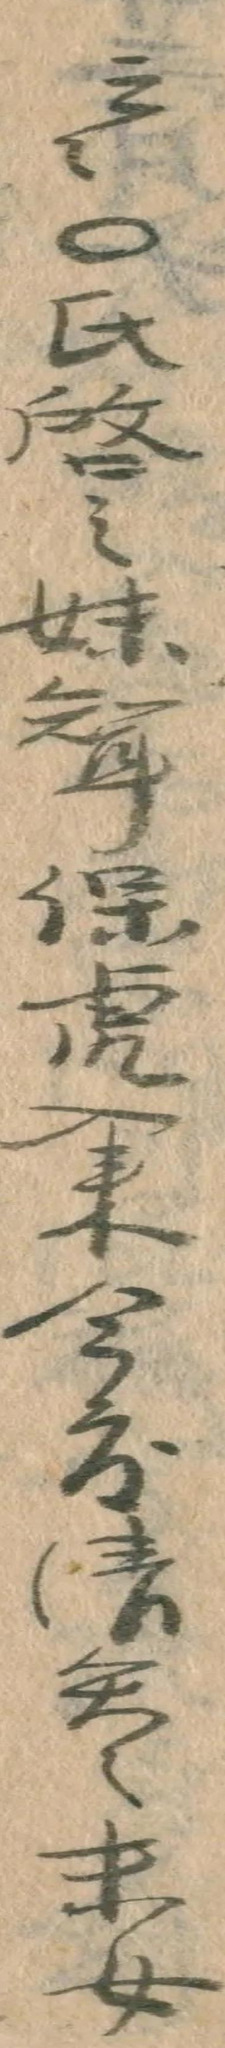云々、◯氏啓之妹聟保虎入来、今度清矢之末女
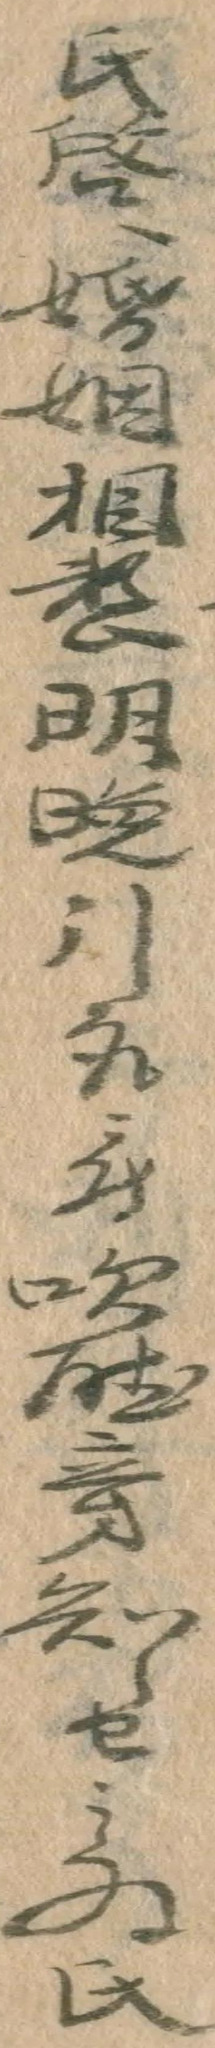氏へ婚姻相整明晩引取ニ付吹聴旁知らセ、被為氏
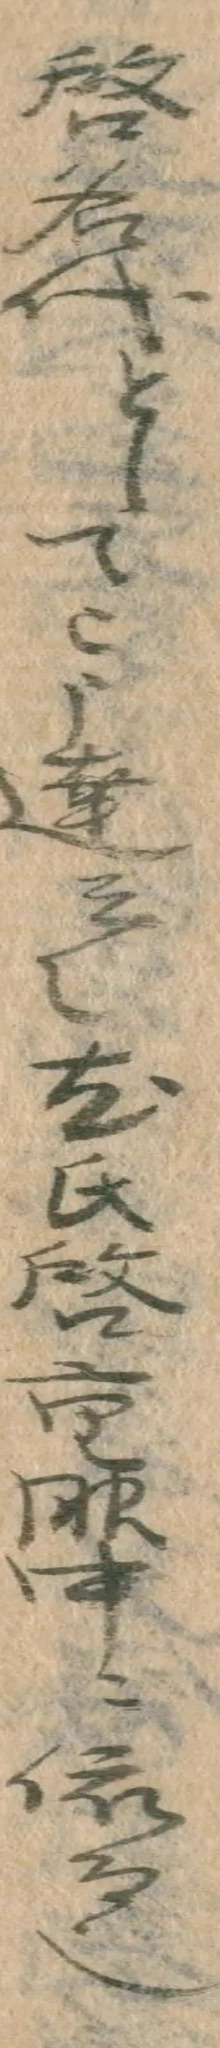啓若代として被申達云々、尤氏啓重服中に依而也、
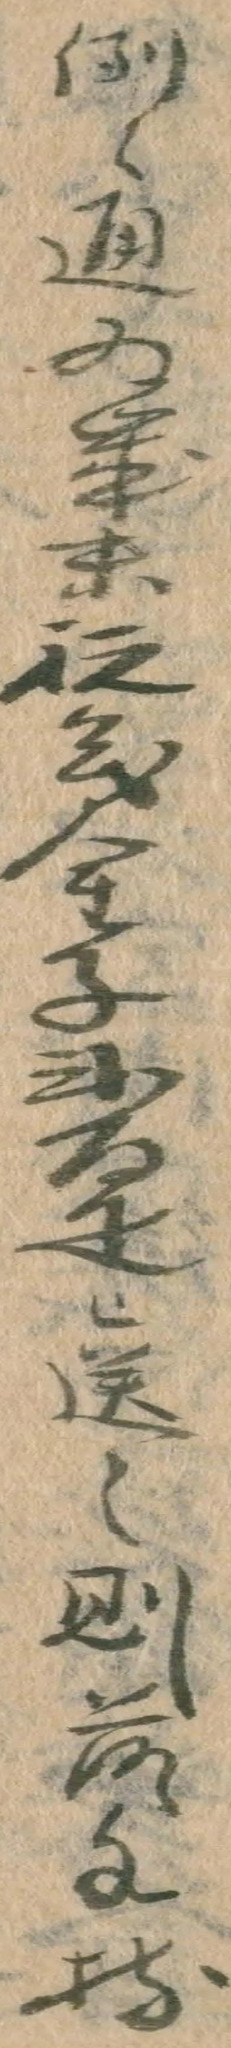例之通為歳未祝義金子弐百疋被送之、則落手持
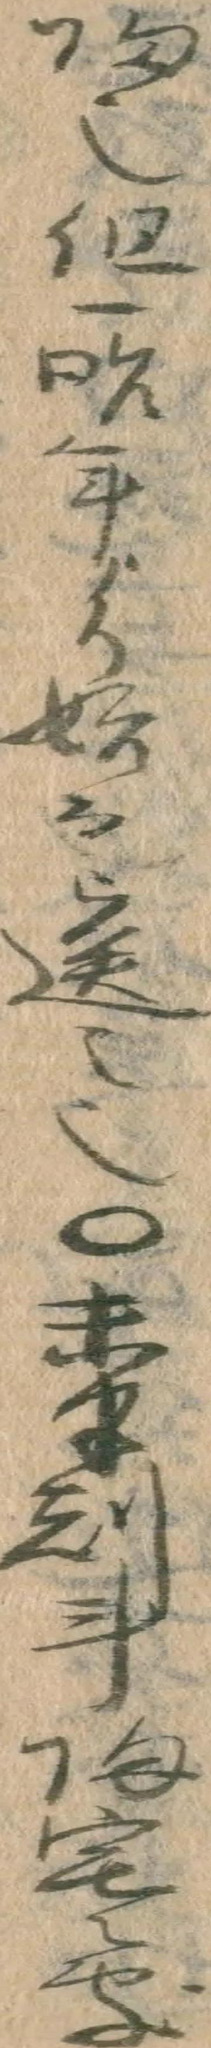帰也、但一昨年より始而送也、○未半刻斗帰宅之處、
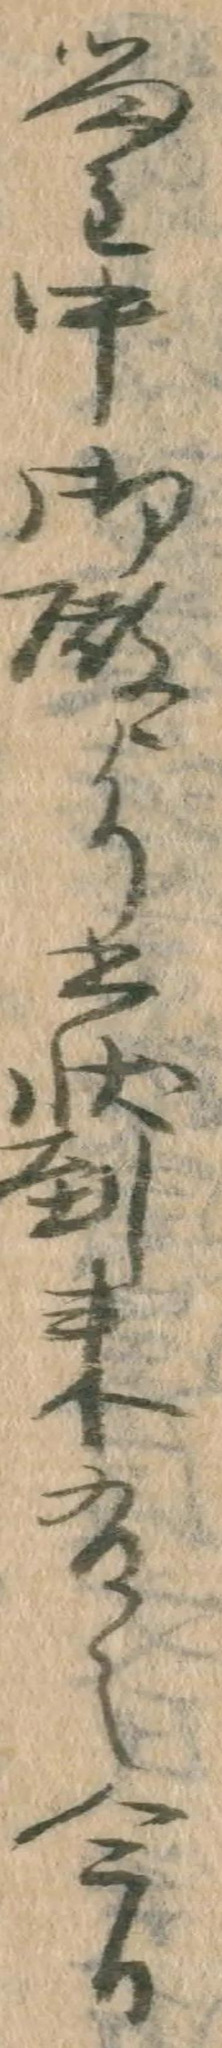留主中御殿より書状到来有之、今日
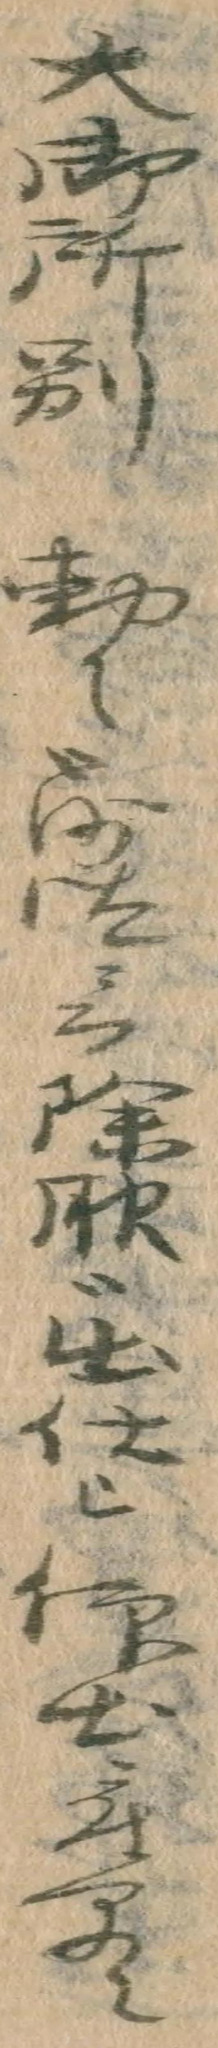大御所別勅し御沙汰ニ而除服御出仕被仰出ニ付、早〻
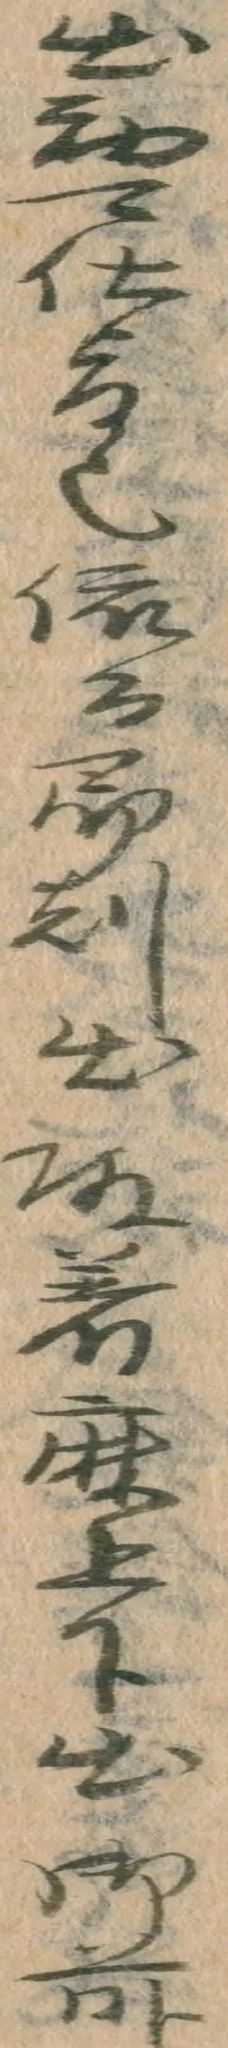出勤可仕旨也、依而即刻出殿、着麻上下、出御前
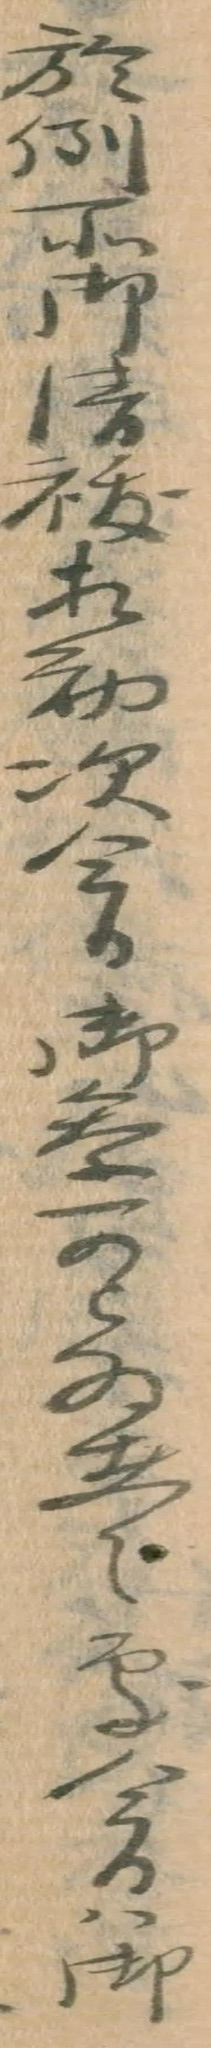於例所御清祓相勤、次今日御参可被為在之處、今日は御
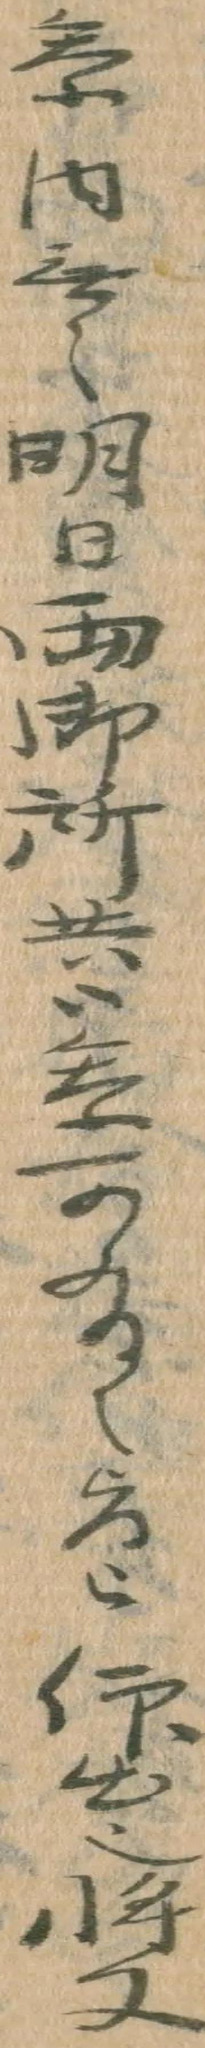参内無之、明日両御所共御参可有之旨被仰出也、将又
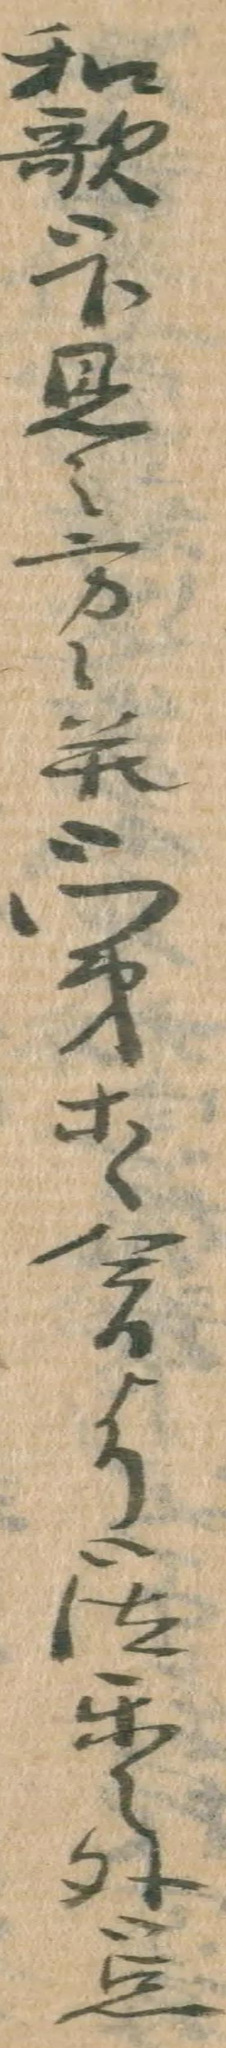和歌御下見之方々并御門弟等へ、今日より御法楽之外御見・
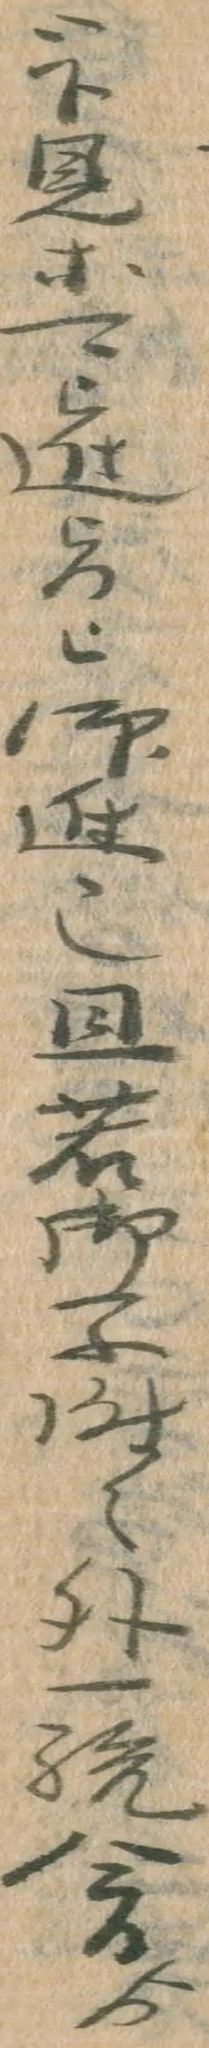御下見等可被進旨被仰進也、且若御子時之外一統今日ゟ
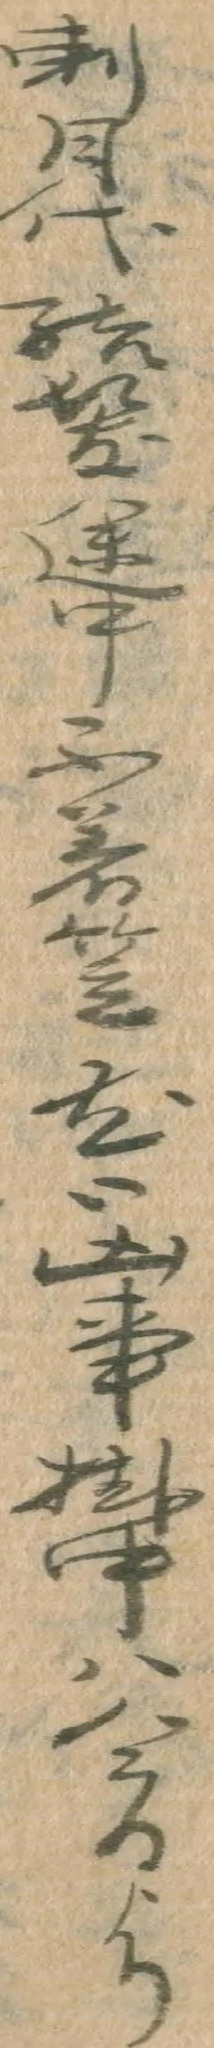刺月代結髪途中不着笠、尤御凶事掛中ハ今日より
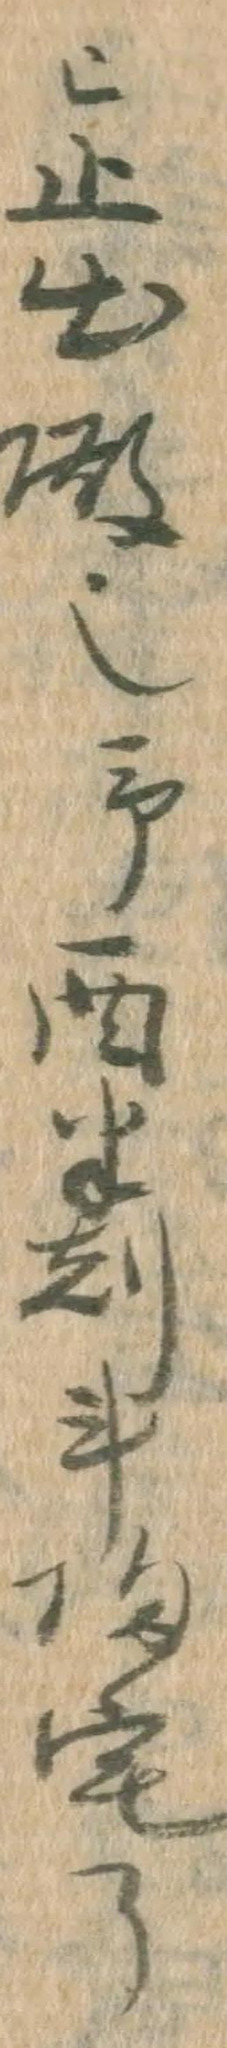被止出殿也、予酉半刻計帰宅了、
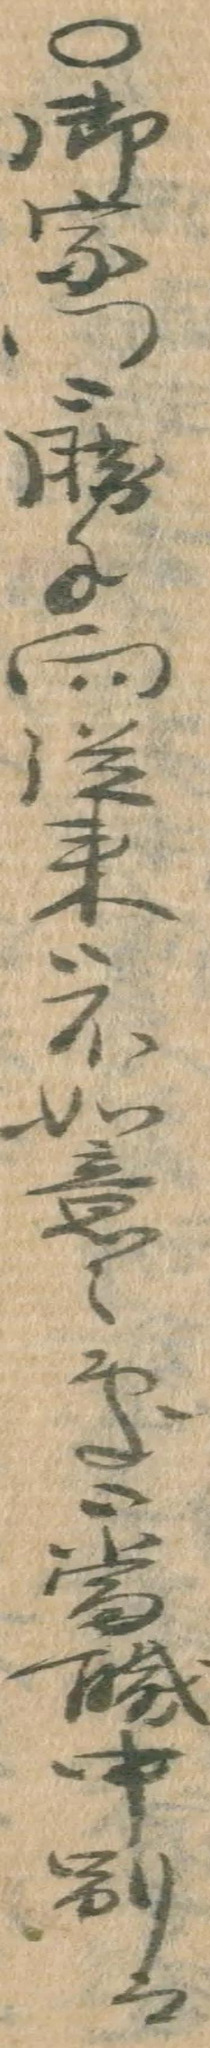○御家門御勝手向、従来御不如意之處、當職中別而
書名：賀茂社記録. 第63冊
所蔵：国立国会図書館 National Diet Library, JAPAN
